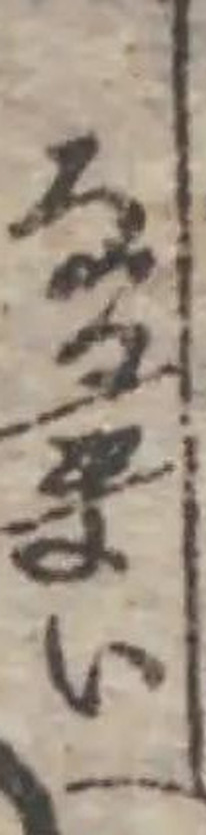なるまい
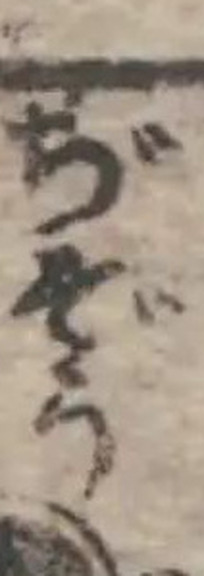ぢぞう
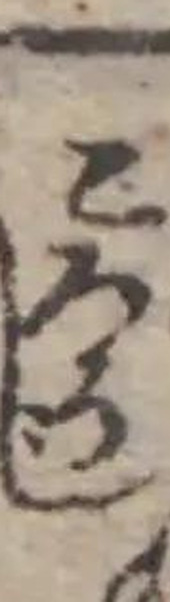ころうじ
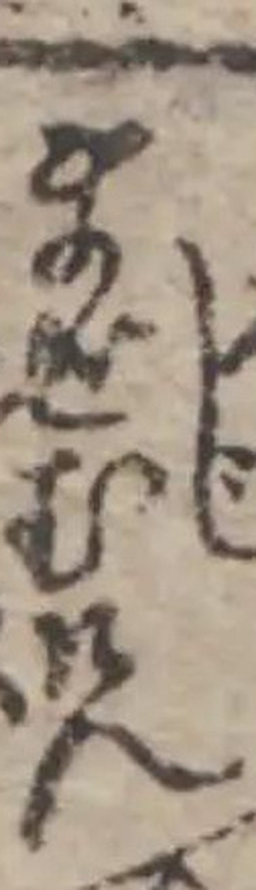ませむけん
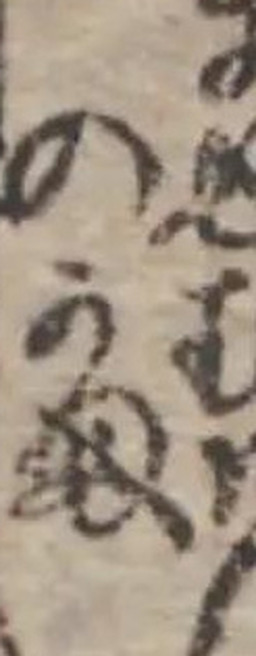のかま
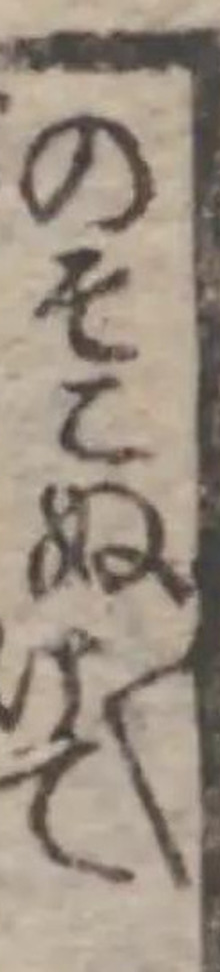のそこぬけて
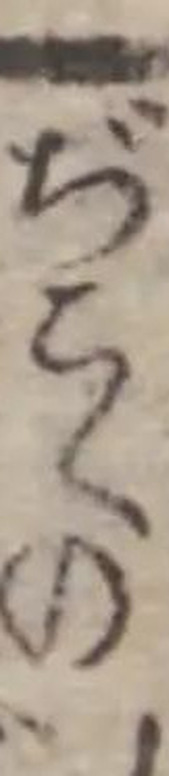ぢこくの
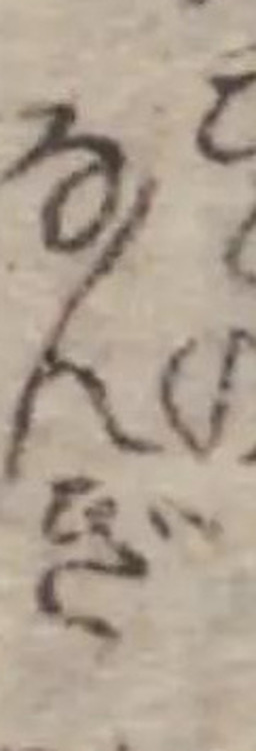なんぎ
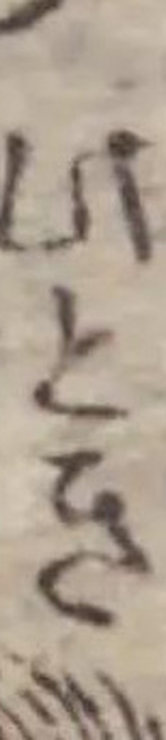此とき
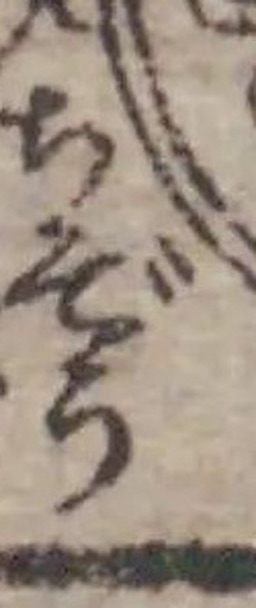ちぞう
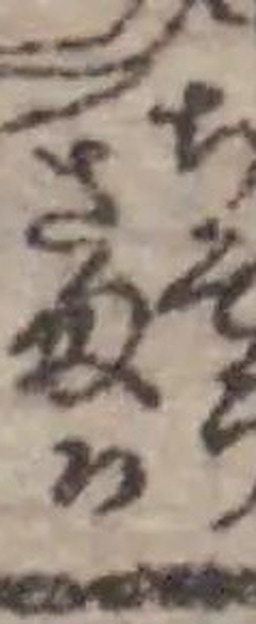さまか
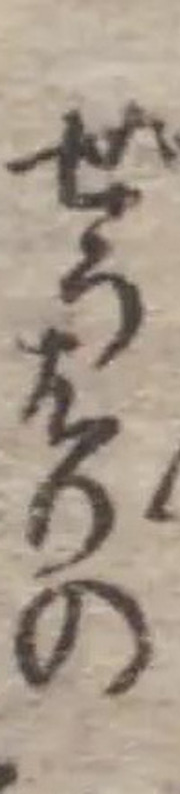ぜうはりの
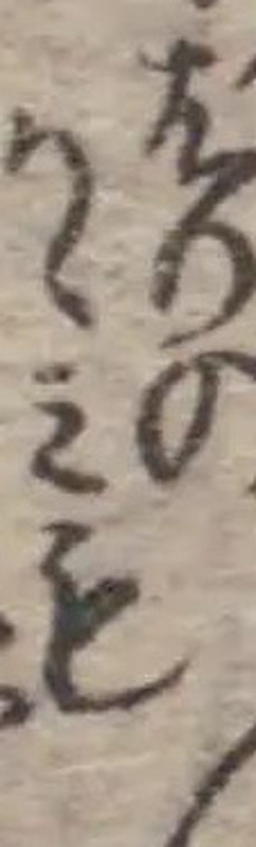かゝみも
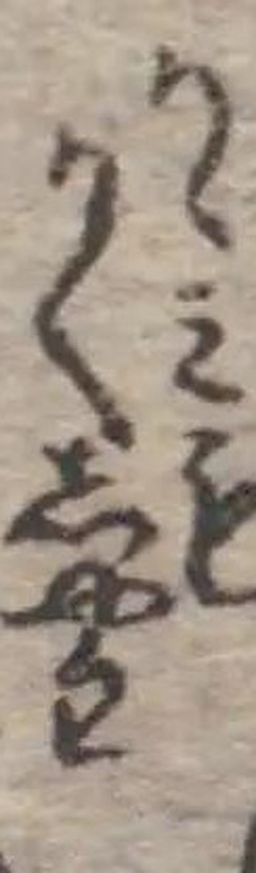かくしやわ
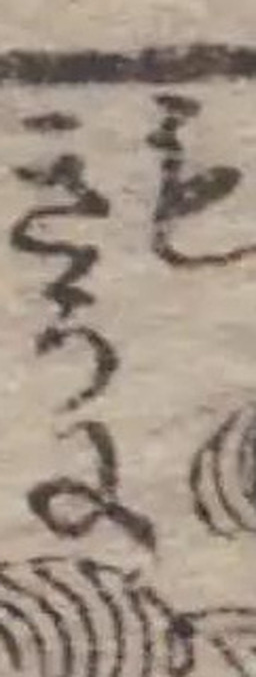きうに
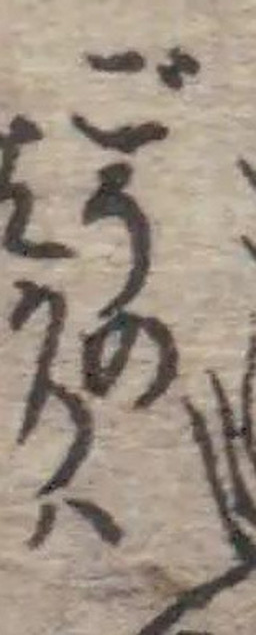はかりは
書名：大磯地蔵咄 2巻
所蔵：国立国会図書館 National Diet Library, JAPAN
